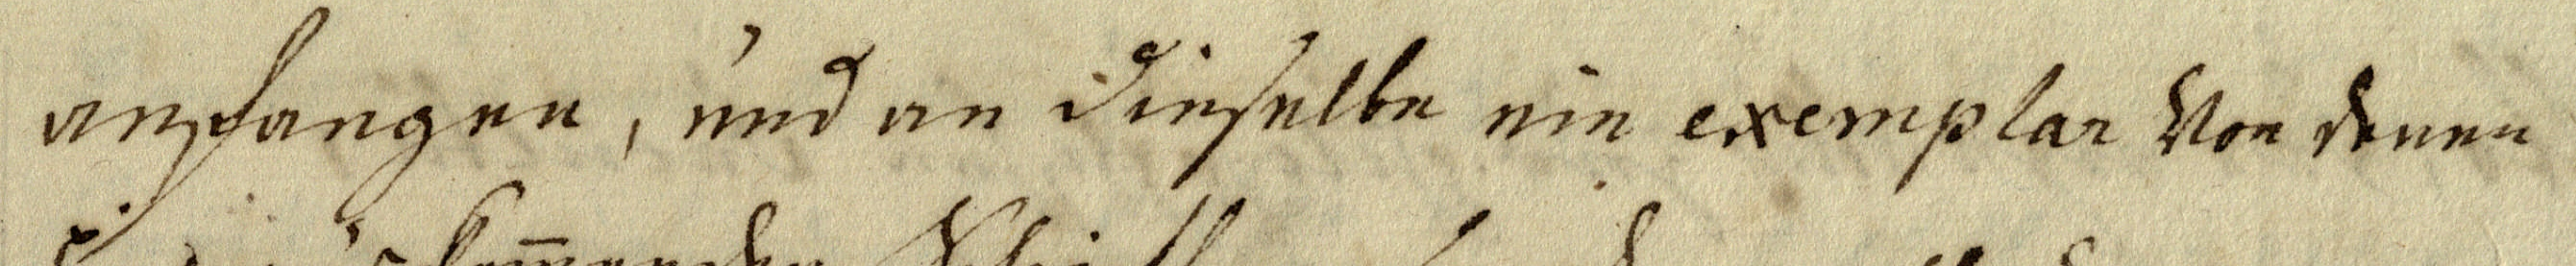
anfangen, und an dieselbe ein exemplar von denen
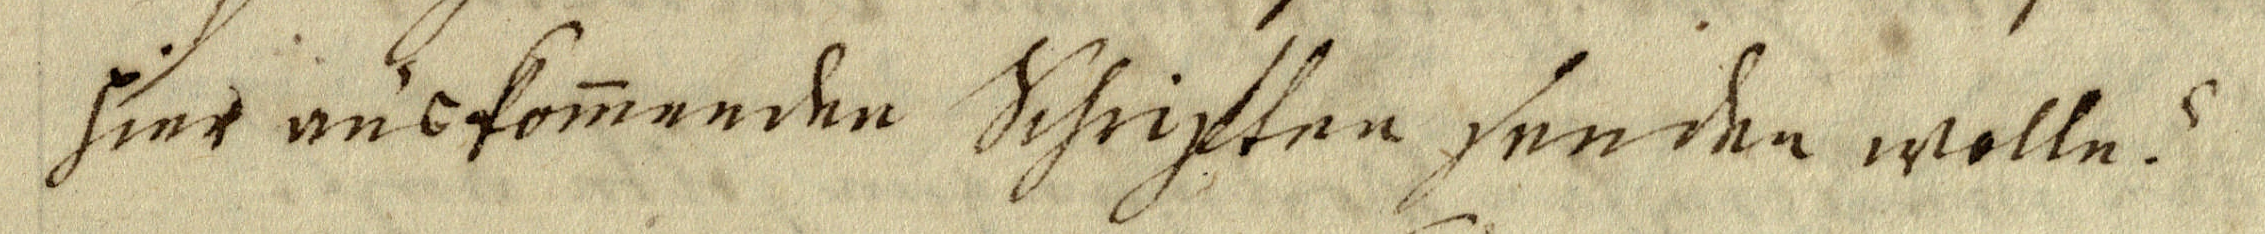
hier auskomenden Schriften senden wolle?
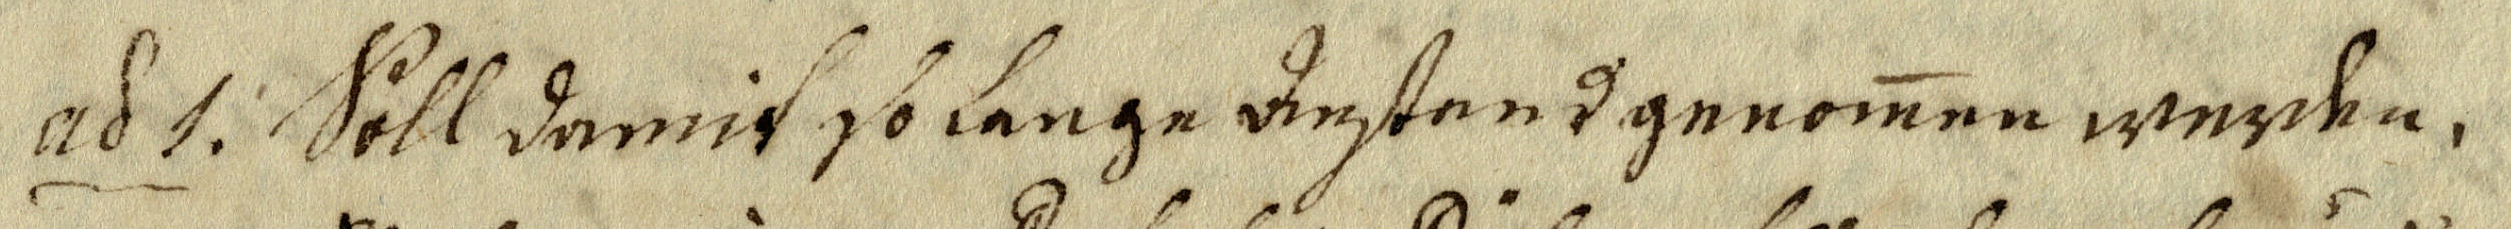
ad 1. Soll damit solange Anstand genomen werden,
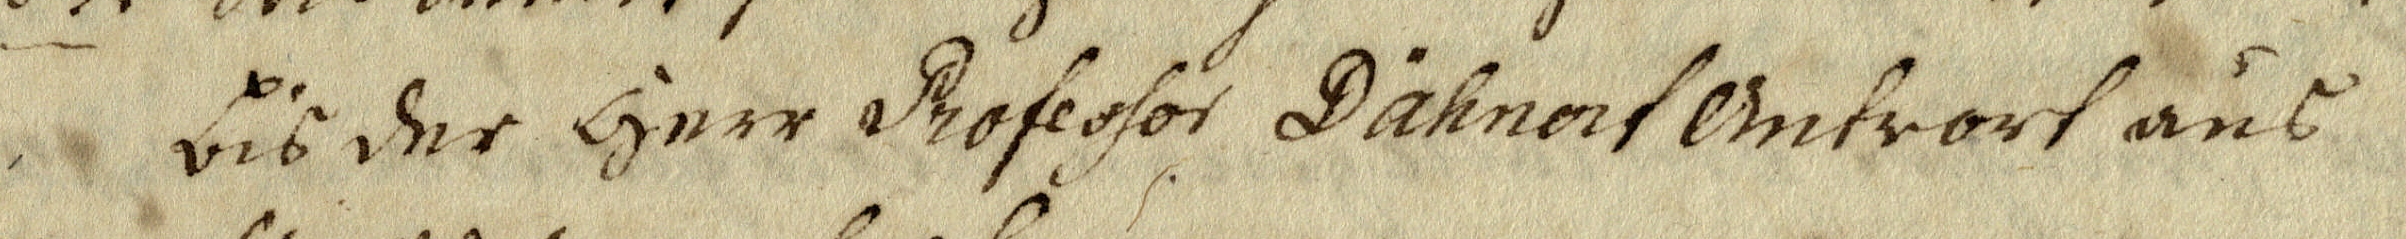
bis der Herr Professor Dähnert Antwort aus
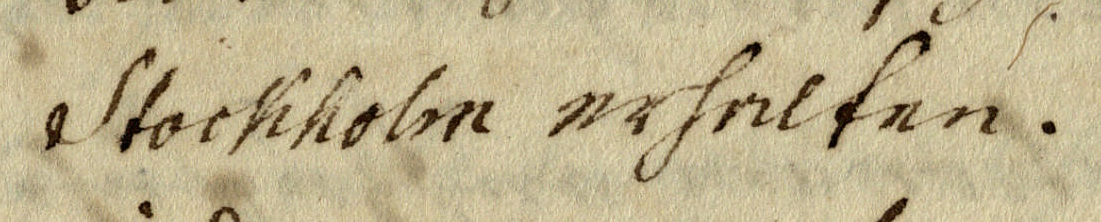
Stockholm erhalten.
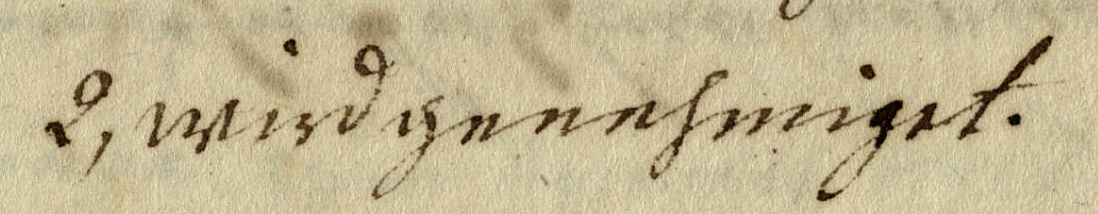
2, wird genehmiget.
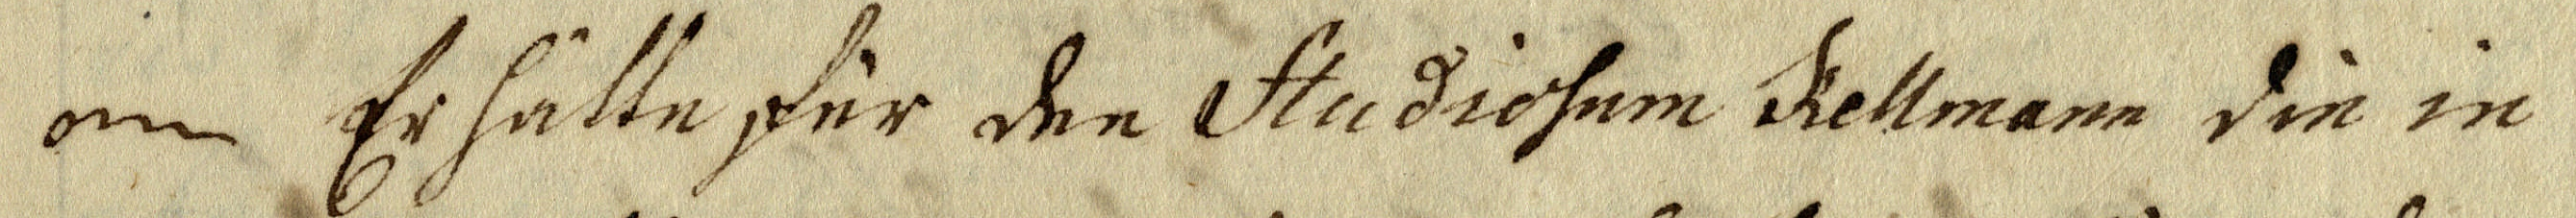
5 Er hätte für den Studiosum Kellmann die in
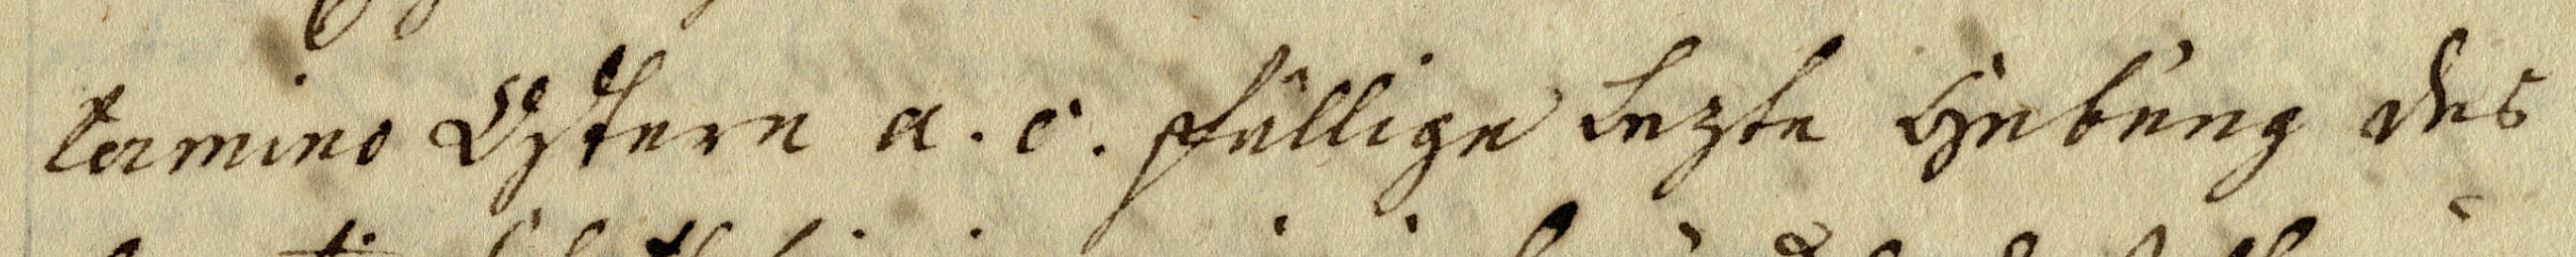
termino Ostern a. c. fällige lezte Hebung des
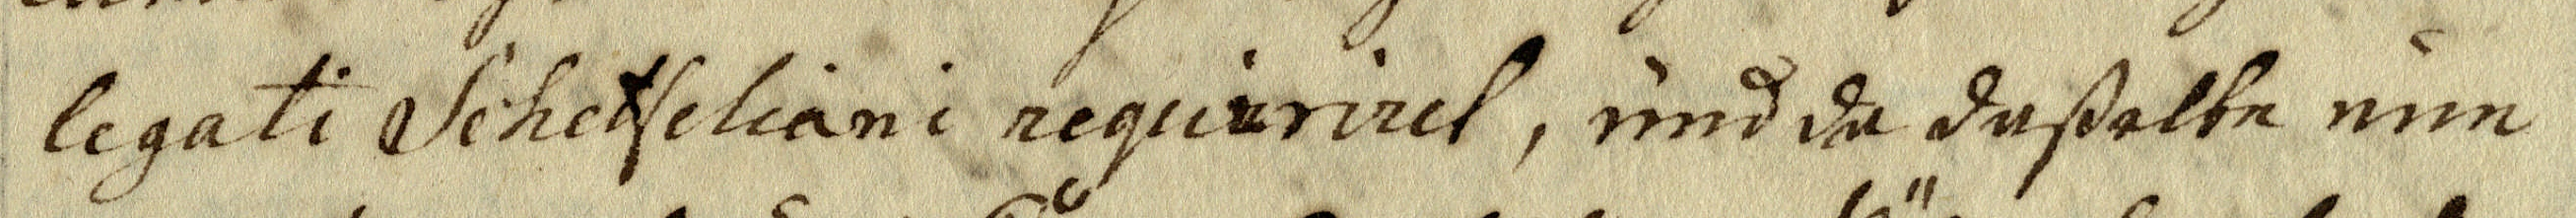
legati Scheffeliani requiriret, und da daßelbe nun
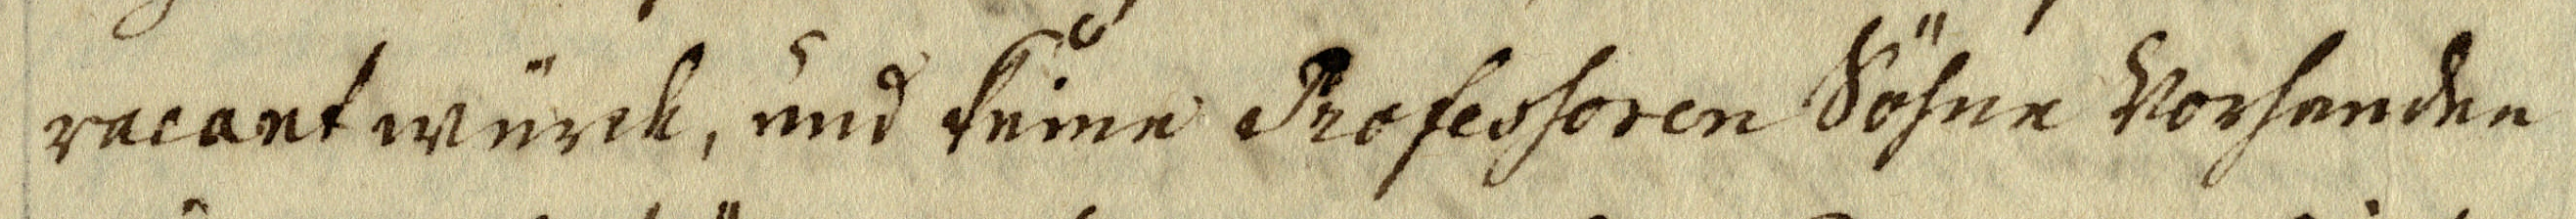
vacant würde, und keien Professoren Söhne vorhanden
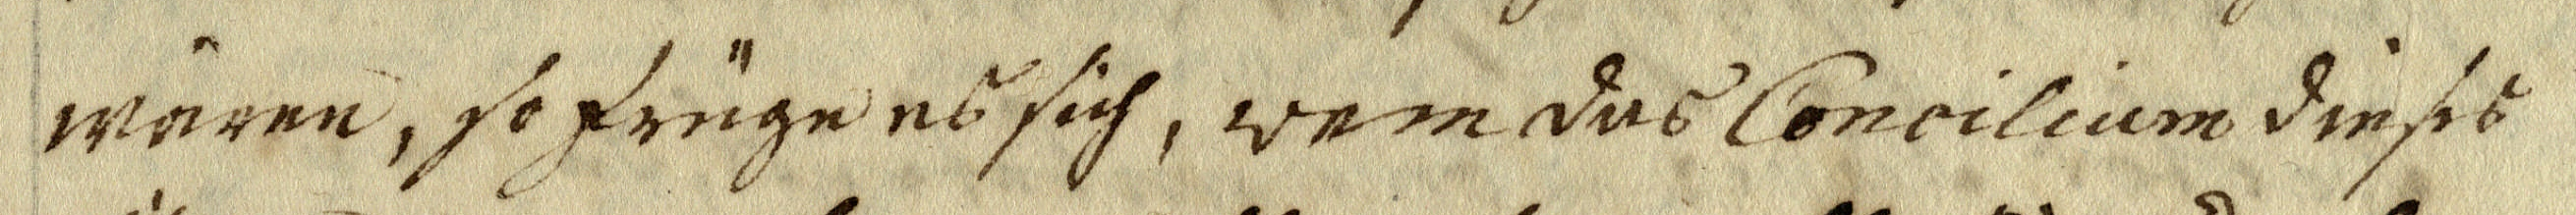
wäre, so früge es sich, wem das Concilium dieses
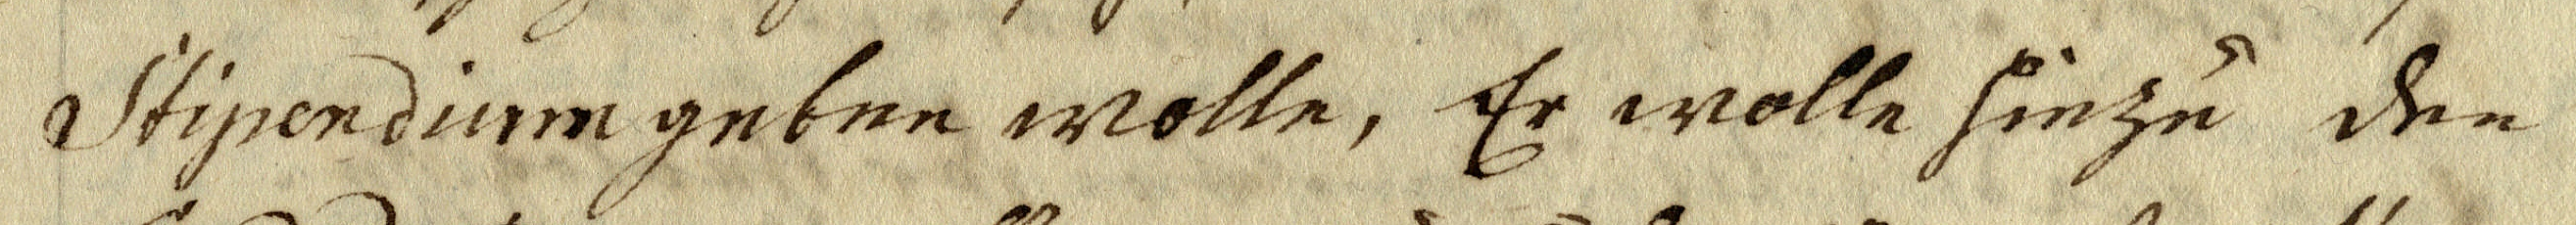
Stipendium geben wolle, Er wolle hiezu den
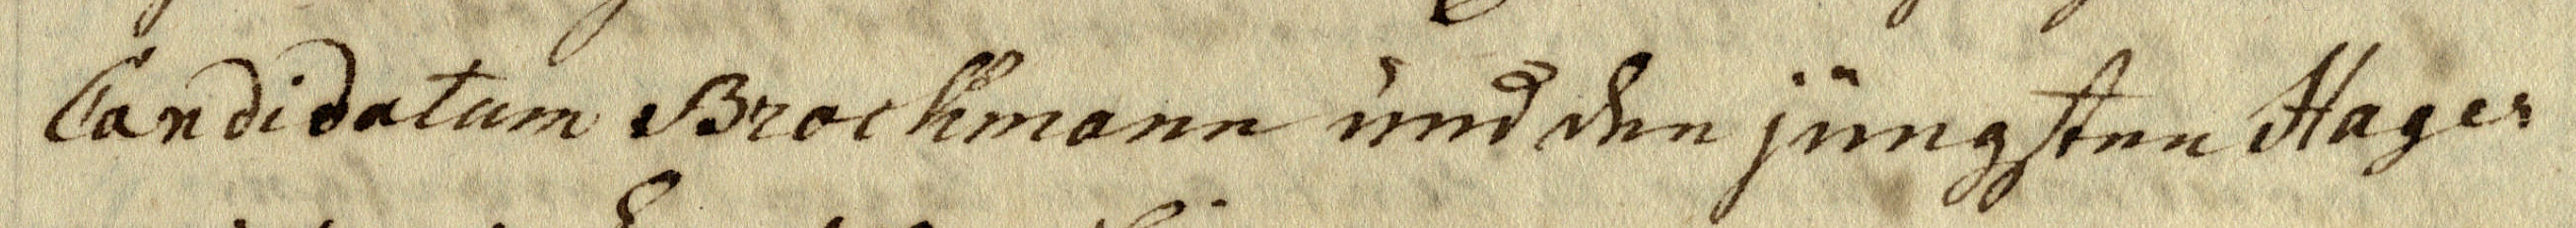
Candidatum Brockmann und den jüngsten Hage¬
